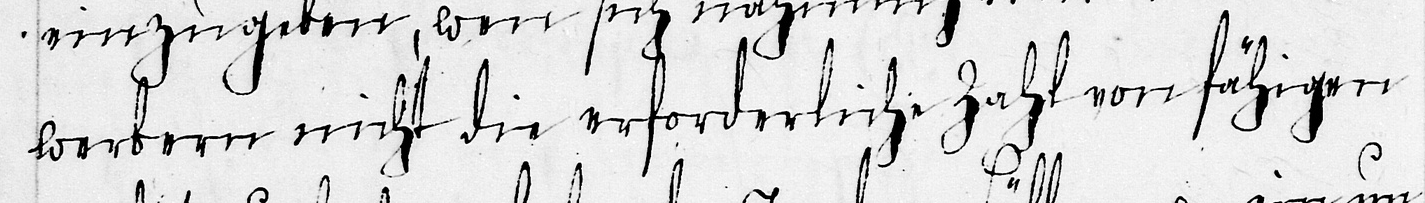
werbern nicht die erforderliche Zahl von fähigen
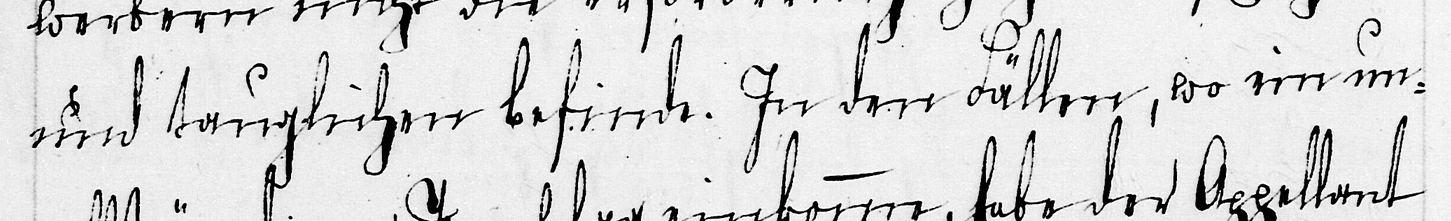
und tauglichen befinde. In den Fällen, wo ein un¬
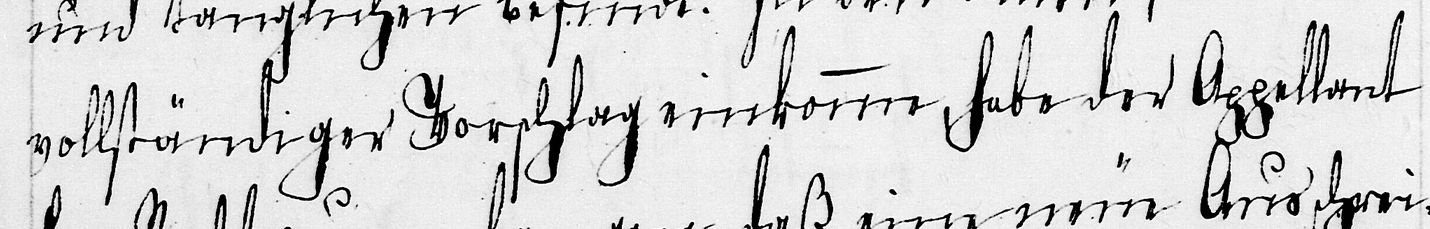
vollständiger Vorschlag einkomme, habe der Appellant
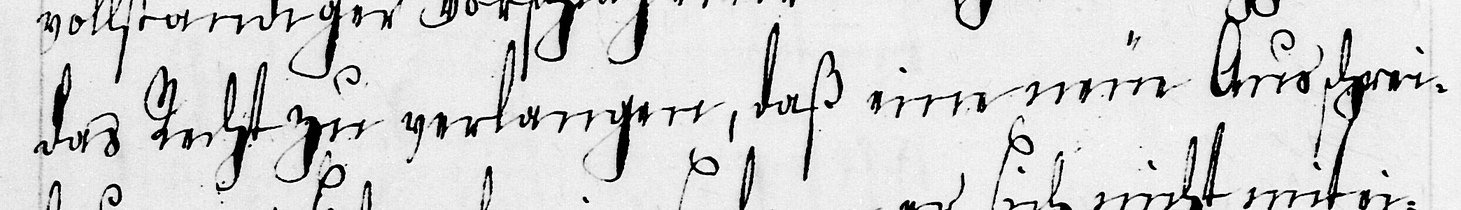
das Recht zu verlangen, daß eine neue Ausschrei¬
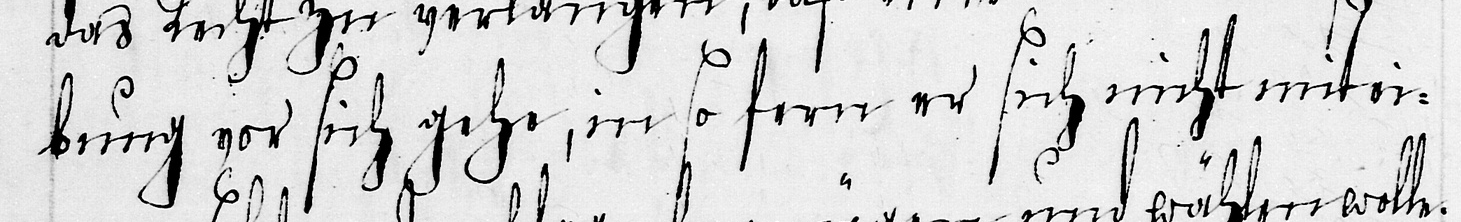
bung vor sich gehe, in so fern er sich nicht mit ei¬
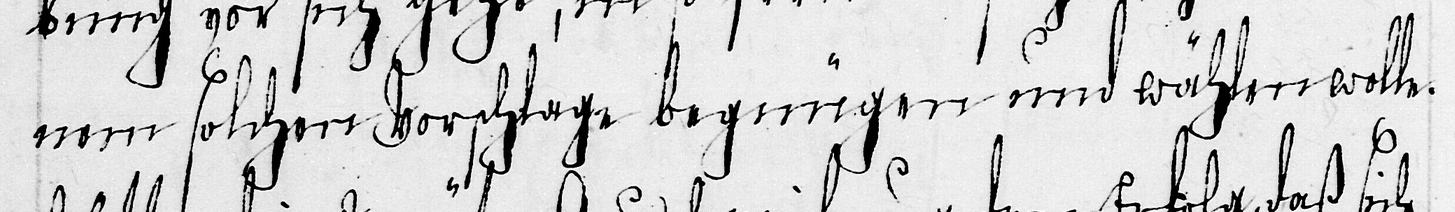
nem solchen Vorschlage begnügen und wählen wolle.
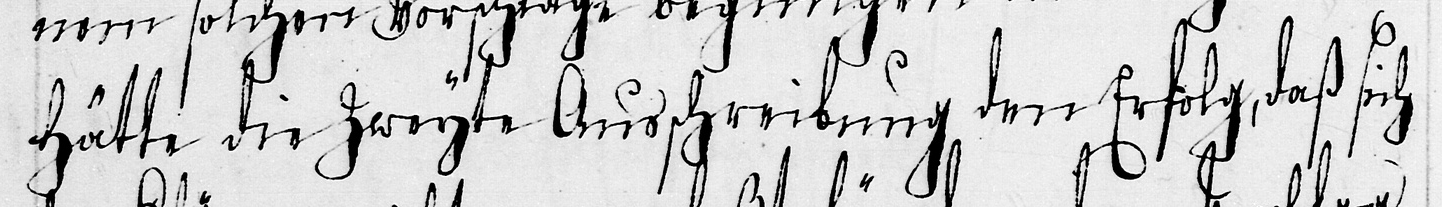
Hätte die zweyte Ausschreibung den Erfolg, das sich
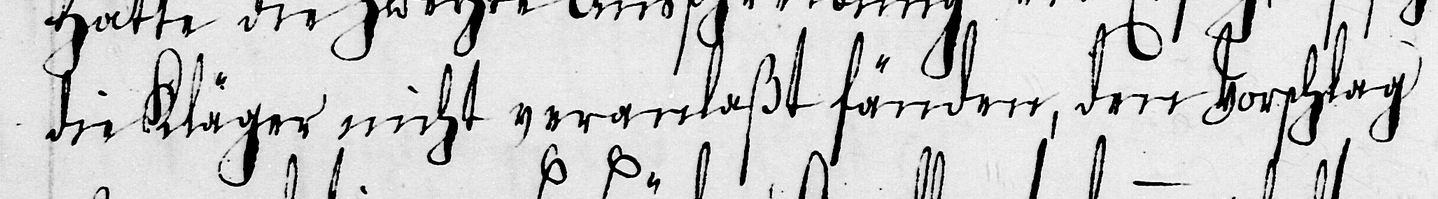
die Kläger nicht veranlaßt fänden, den Vorschlag
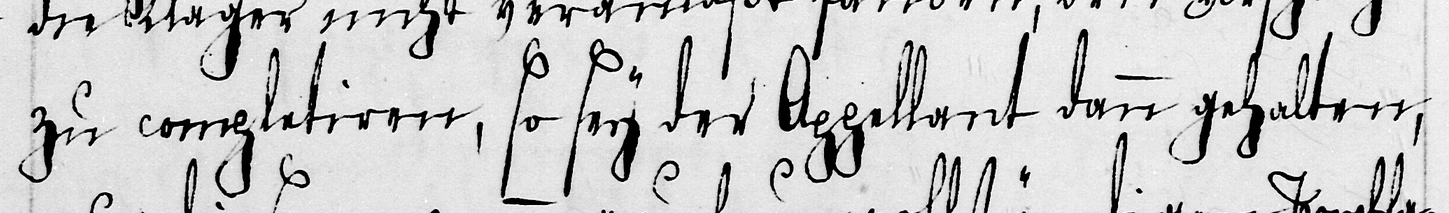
zu completiren, so sey der Appellant dann gehalten,
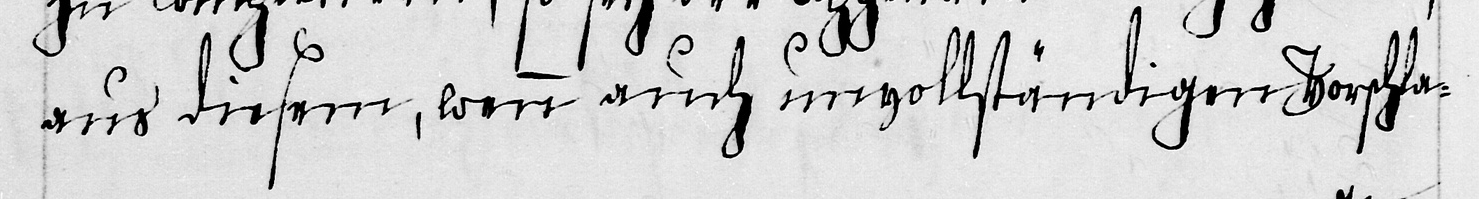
aus diesem, wenn auch unvollständigen Vorschla-
